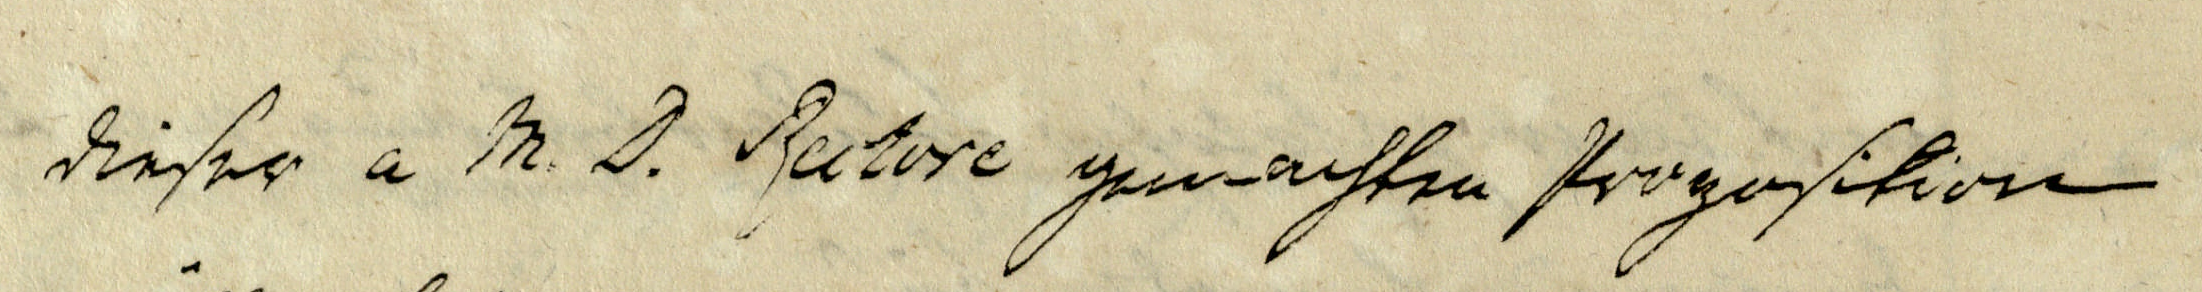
dieser a M. D. Rectore gemachten Proposition
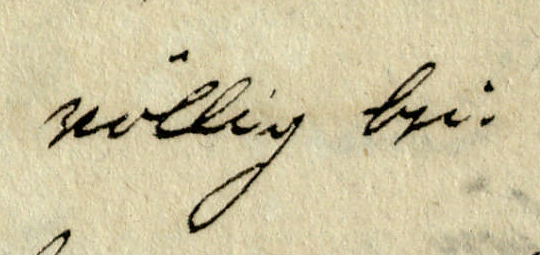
völlig bei.
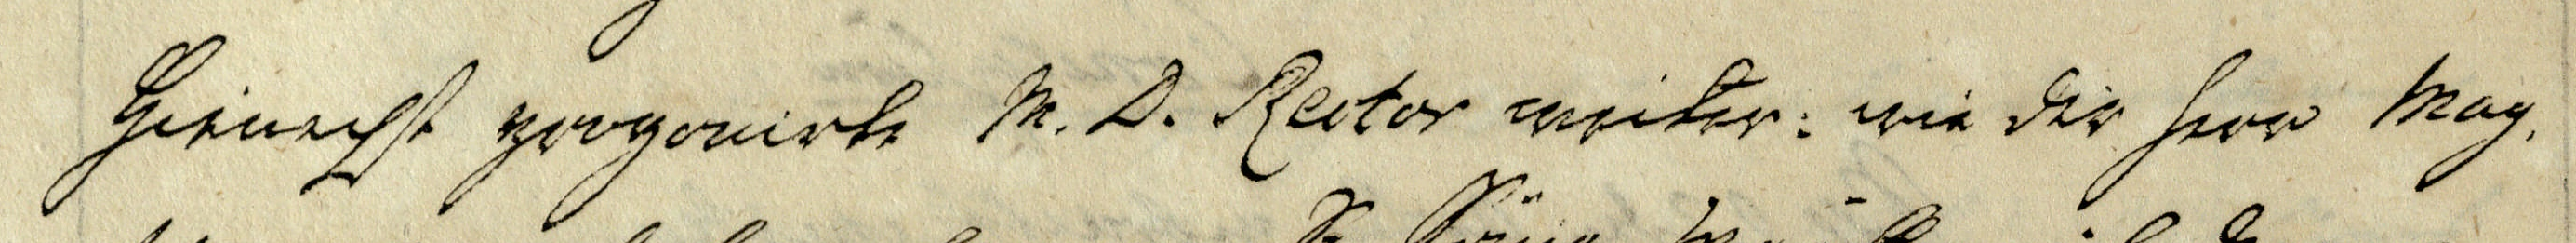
Hienechst proponirte M. D. Rector weiter: wie der Herr Mag.
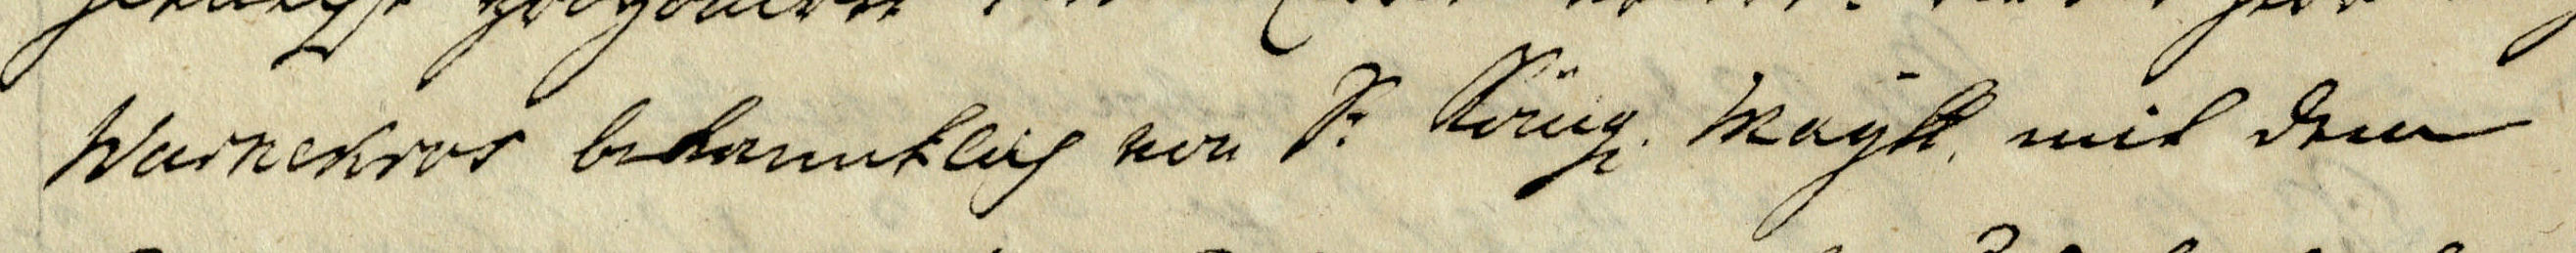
Warnekros bekanntlich von Sr König. Maÿtt. mit dem
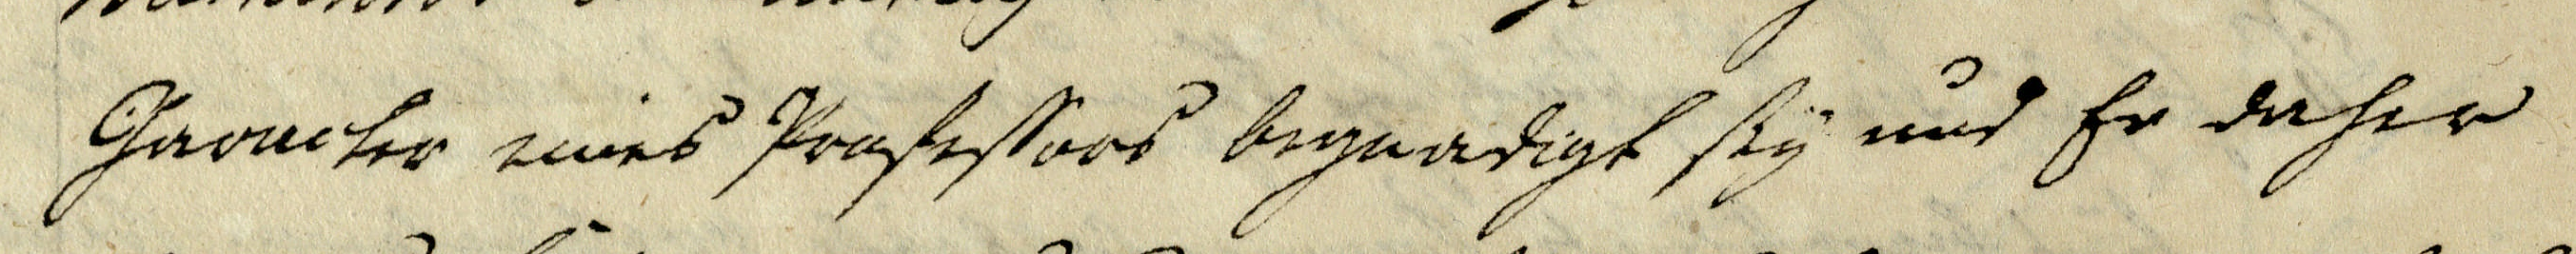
Character eines Professors begnadiget seÿ und Er daher
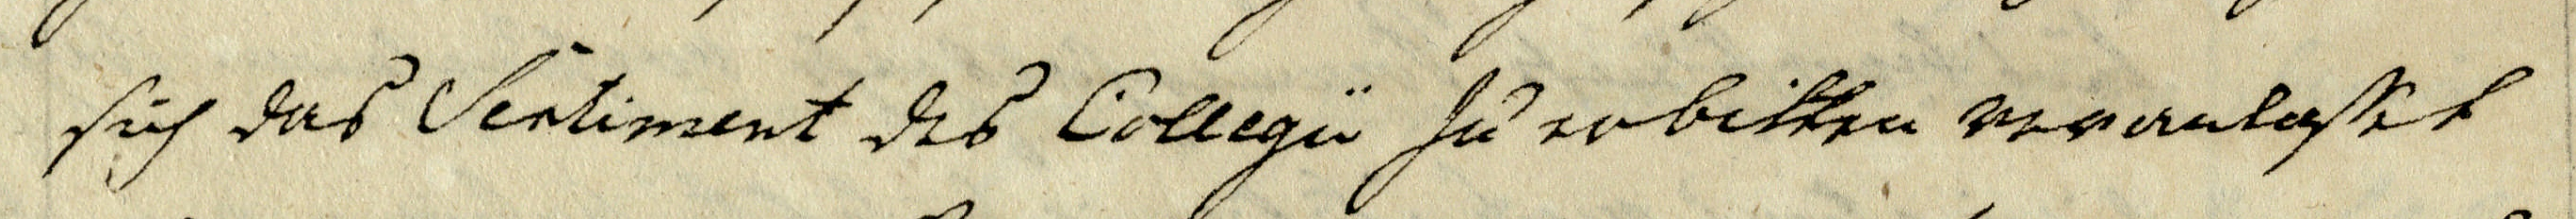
sich das Sentiment des Collegii zu erbitten veranlasset
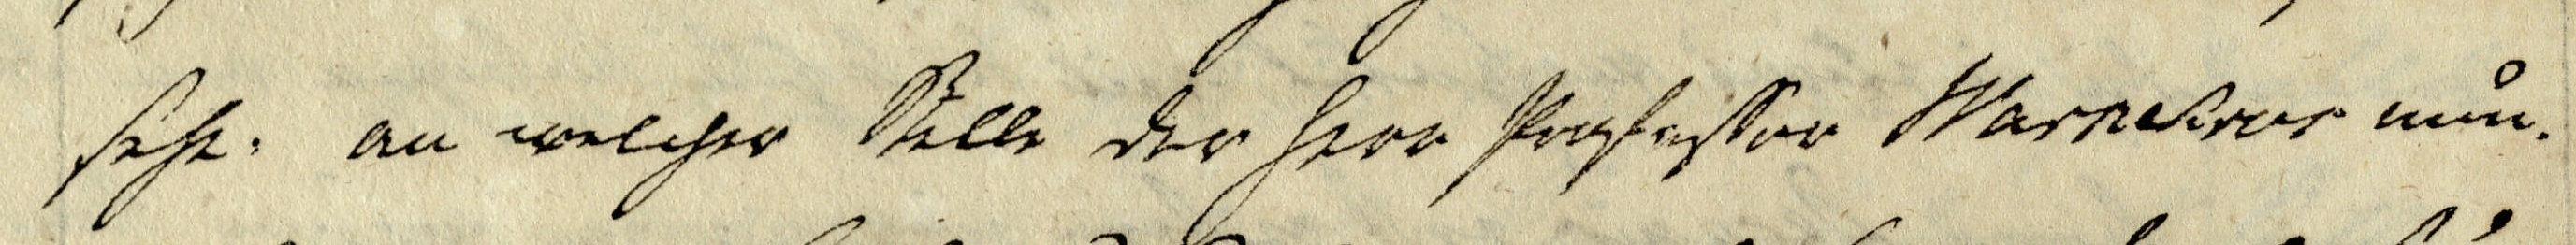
sehe. an welcher Stelle der Herr Professor Warnekros nun¬
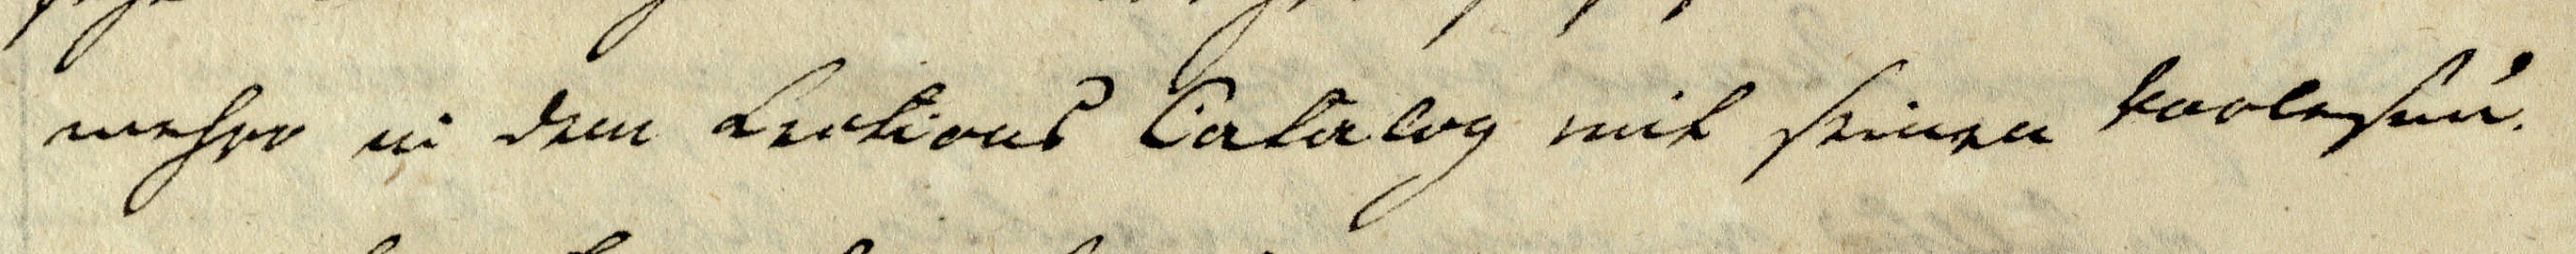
mehro in dem Lections Catalog mit seinen Vorlesun¬
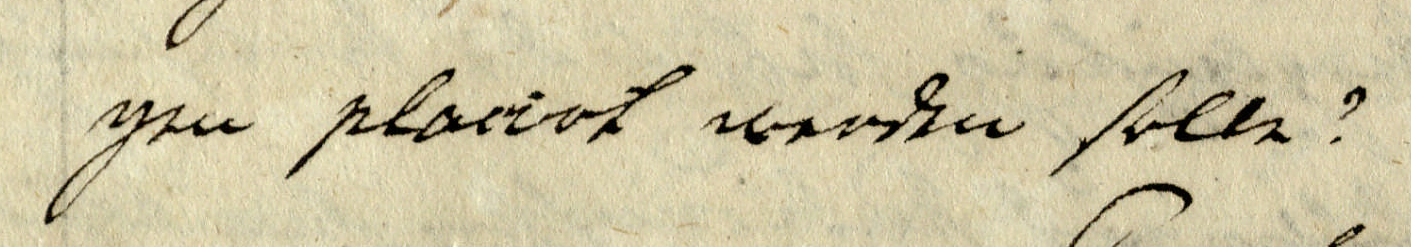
gen placirt werden solle?
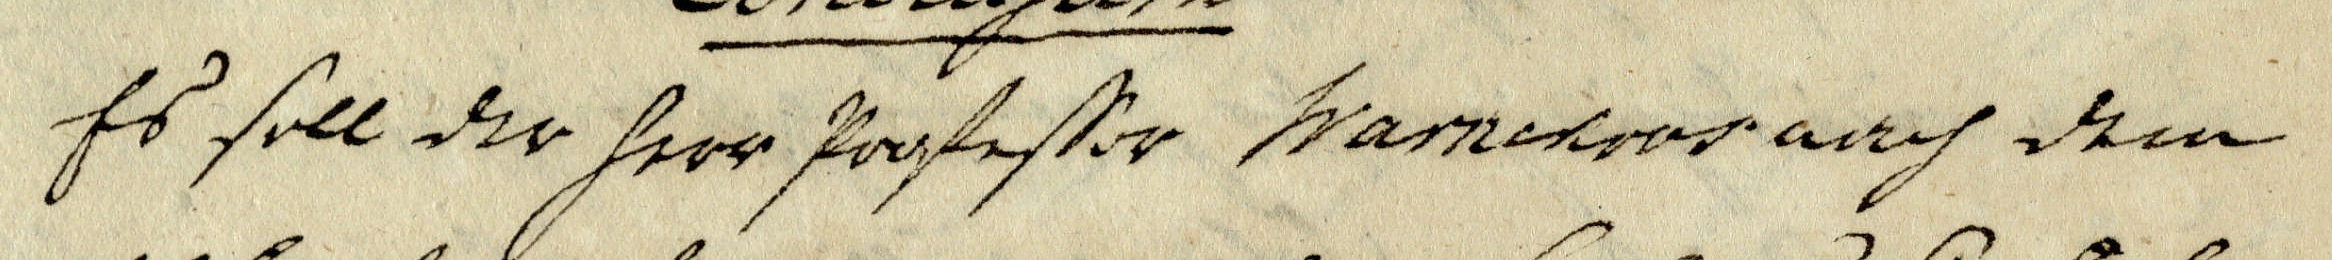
Es soll der Herr Professor Warnekros nach dem
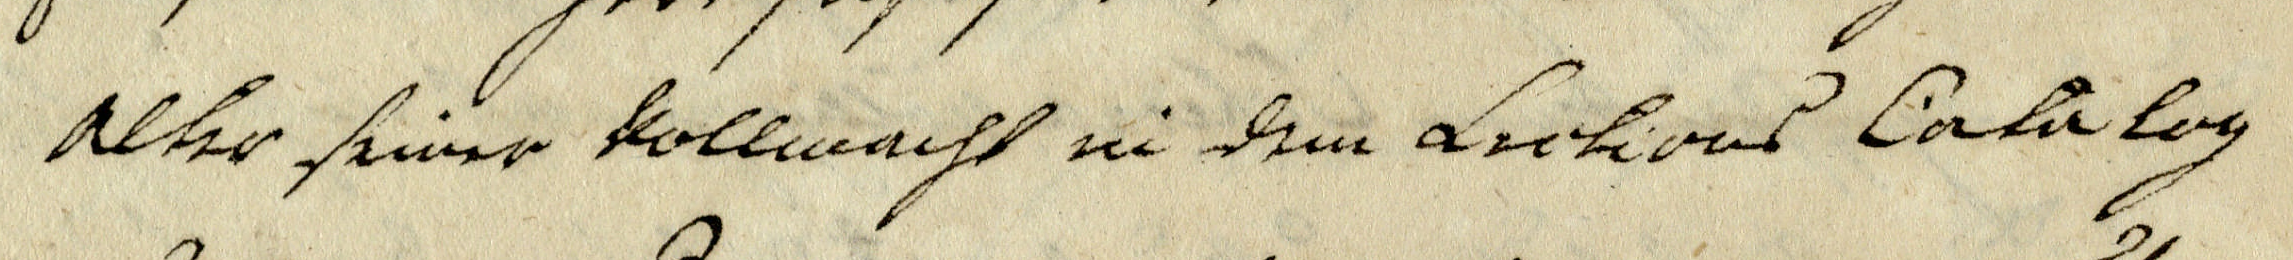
Alter seiner Vollmacht in dem Lections Catalog
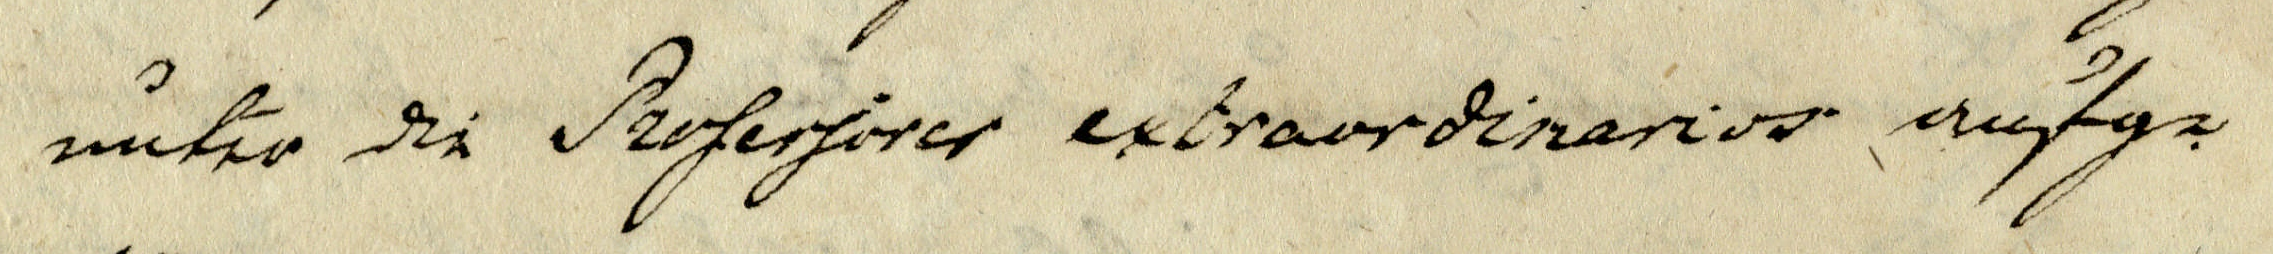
unter die Professores extraordinarios aufge¬
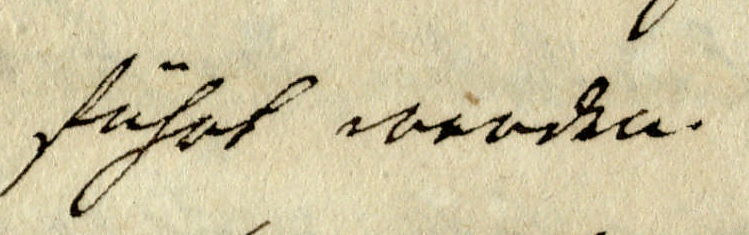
führt werden.
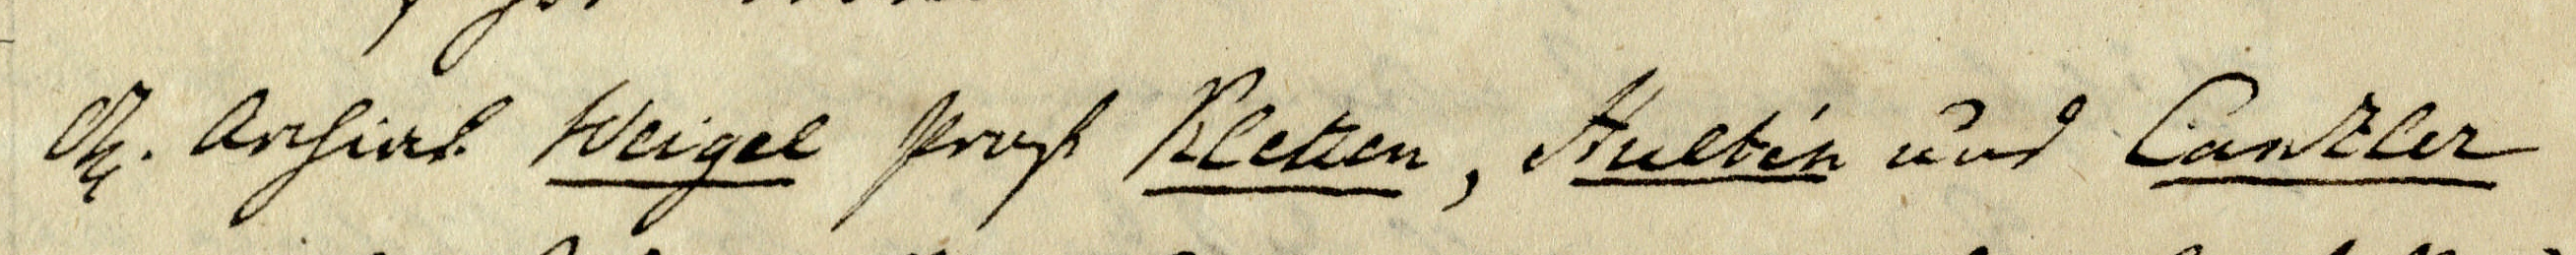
dh. Archiat. Weigel Prof Kletten, Hultén und Canzler
